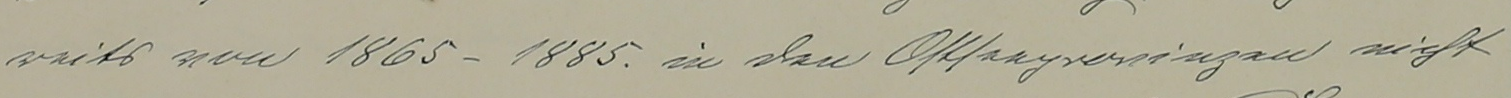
reits von 1865-1885. in den Ostseeprovinzen nicht
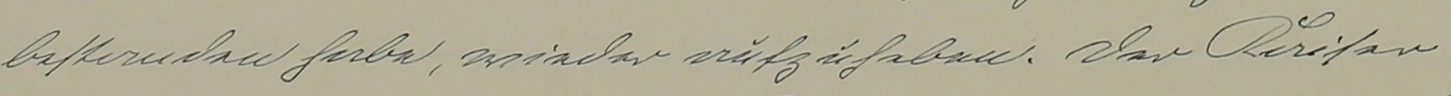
bestanden habe, wieder aufzuheben. Der Kaiser
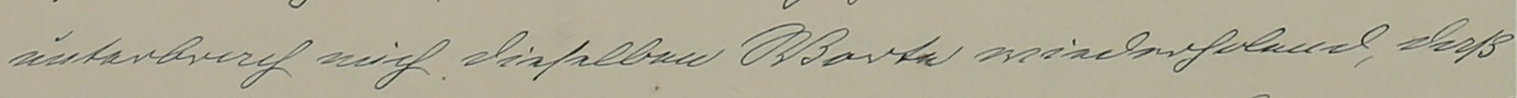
unterbrach mich dieselben Worte wiederholend, daß
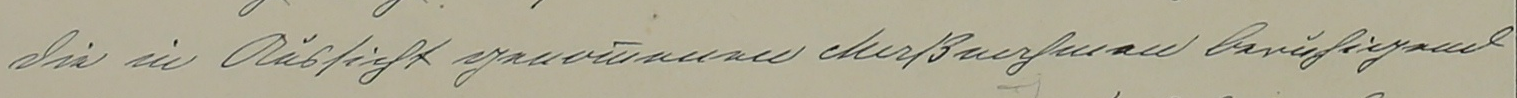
die in Aussicht genommenen Maßnahmen beruhigend
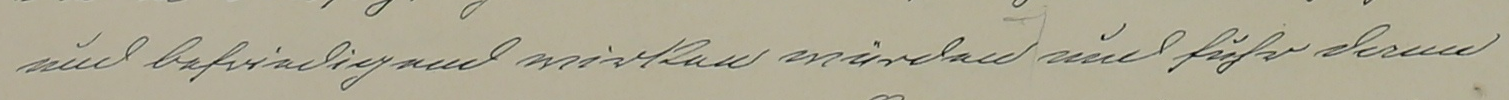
und befriedigend wirken würden und fuhr dann
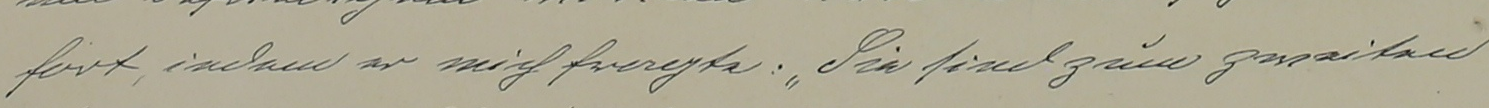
fort, indem er mich fragte: „Sie sind zum zweiten
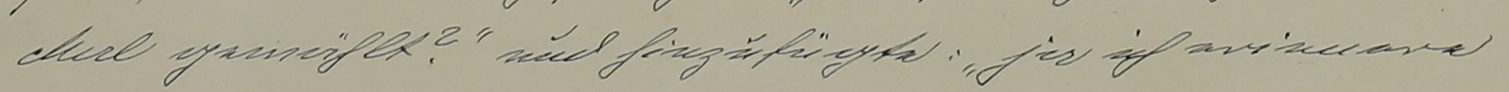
Mal gewählt?“ und hinzufügte: „ja ich erinnere
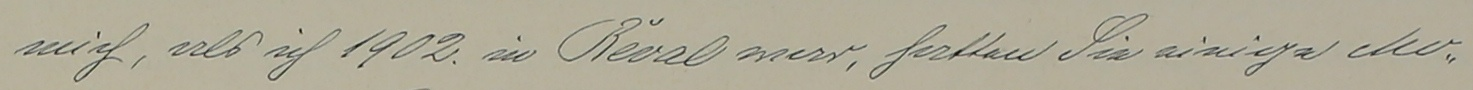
mich, als ich 1902. in Reval war, hatten Sie einige Mo-
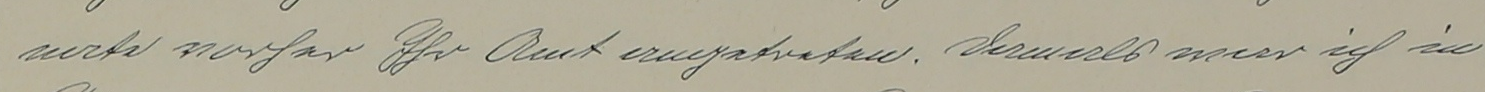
nate vorher Ihr Amt angetreten. Damals war ich in
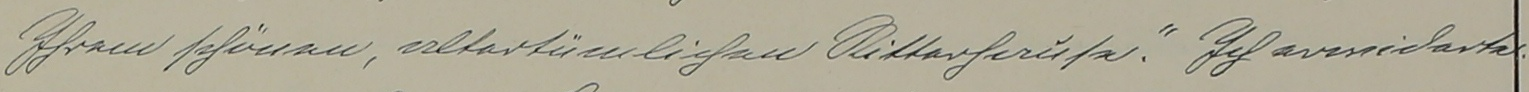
Ihrem schönen, altertümlichen Ritterhause.“ Ich erwiderte:
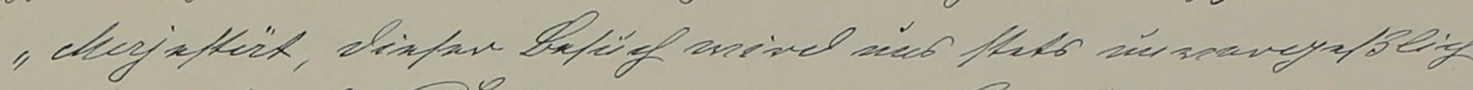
„Majestät, dieser Besuch wird uns stets unvergeßlich
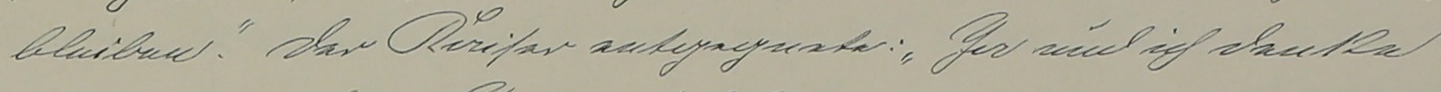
bleiben.“ Der Kaiser entgegnete: „Ja, auch ich denke
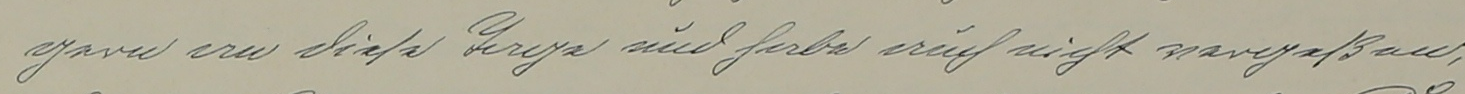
gern an diese Tage und habe auch nicht vergeßen,
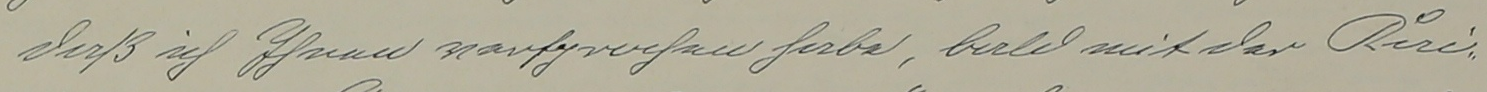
daß ich Ihnen versprochen habe, bald mit der Kai-
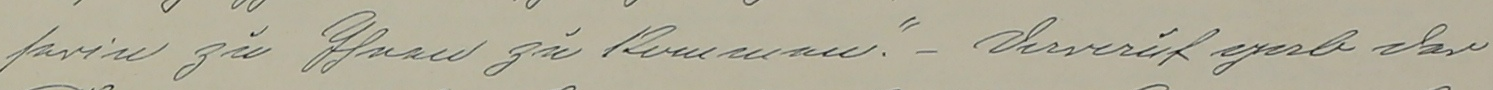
serin zu Ihnen zu kommen.“ – Darauf gab der
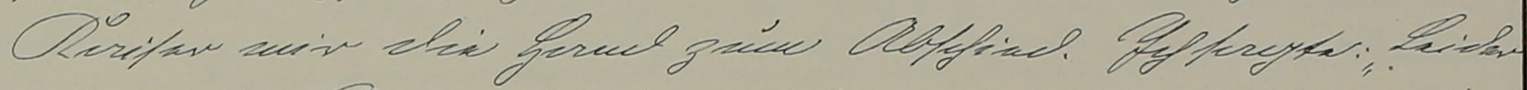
Kaiser mir die Hand zum Abschied. Ich sagte: „Leider
